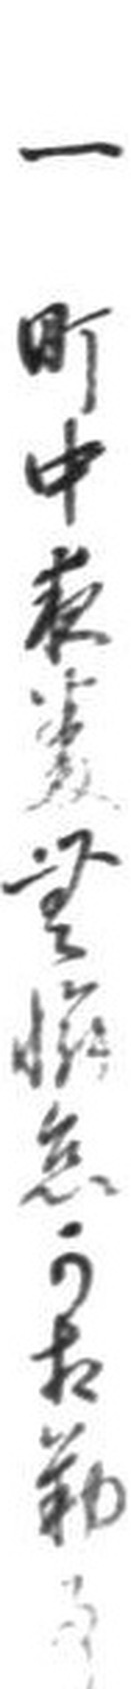一町中夜番無懈怠可相勤事

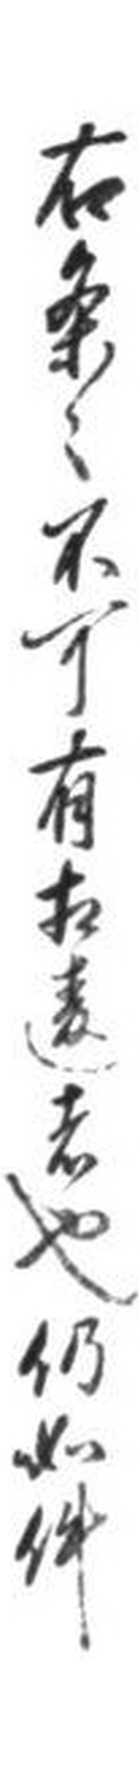右条々不可有相違者也仍如件
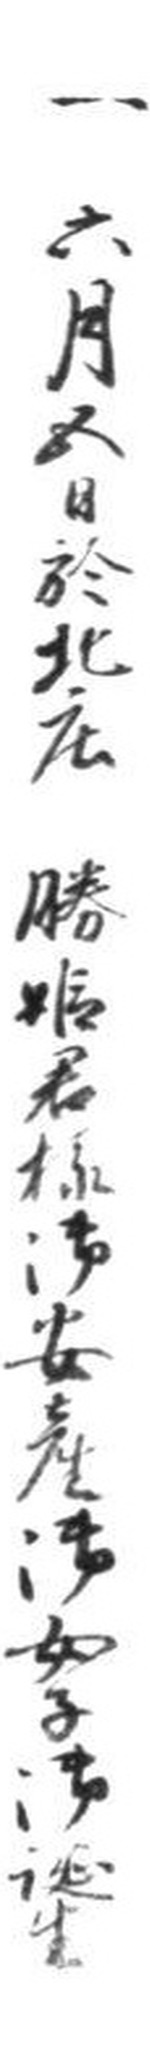一六月五日於北庄勝姫君様御安産御女子御誕生
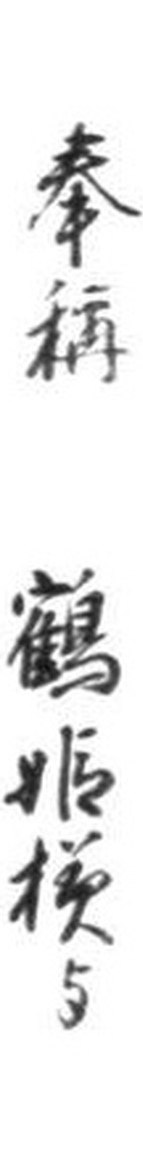奉称鶴姫様与
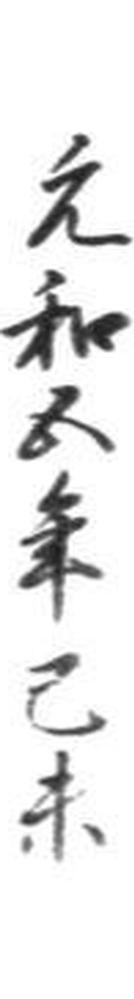元和五年巳未
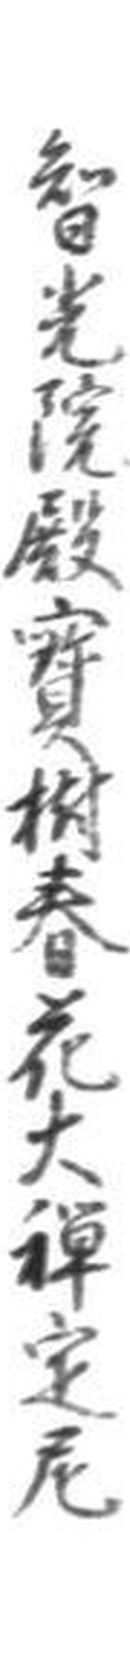智光院殿宝寿樹春花大禅定尼
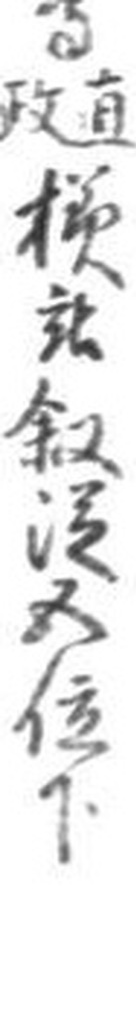政様被叙従五位下

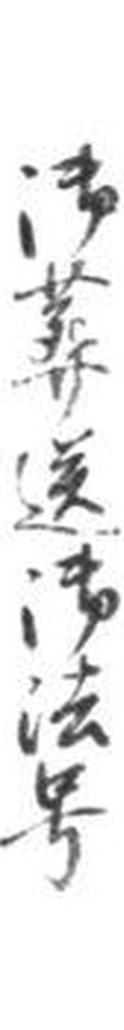御葬送御法号
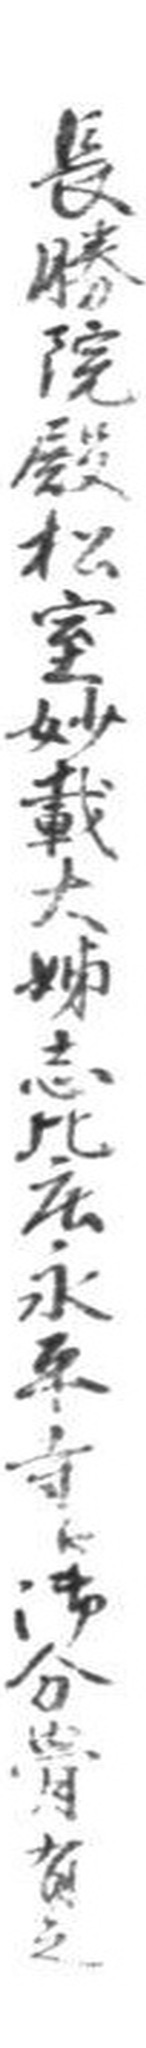長勝院殿松室妙載大姉志比庄永平寺江御分骨有之
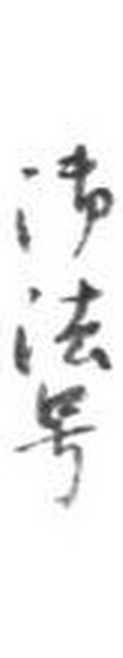御法号
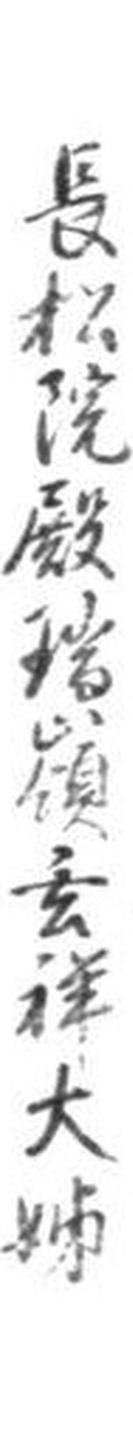長松院殿瑞嶺玄祥大姉
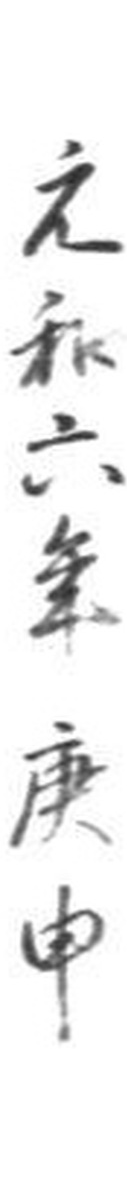元和六年庚申
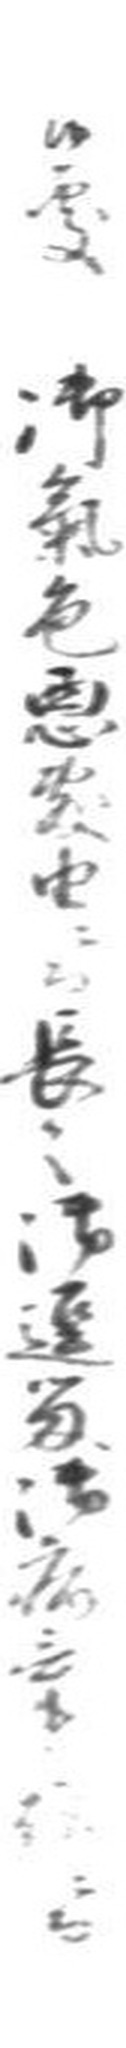候処御気色悪敷由ニ而長々御逗留御病気之趣ニ而
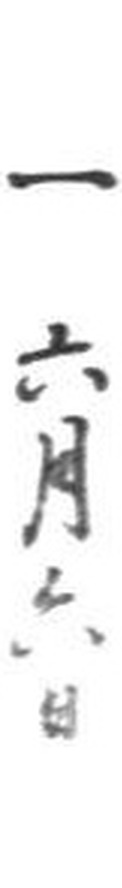一六月六日
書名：家譜 二 忠直公 従文禄四年到慶安四年
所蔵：福井県文書館 Fukui Prefectural Archives
